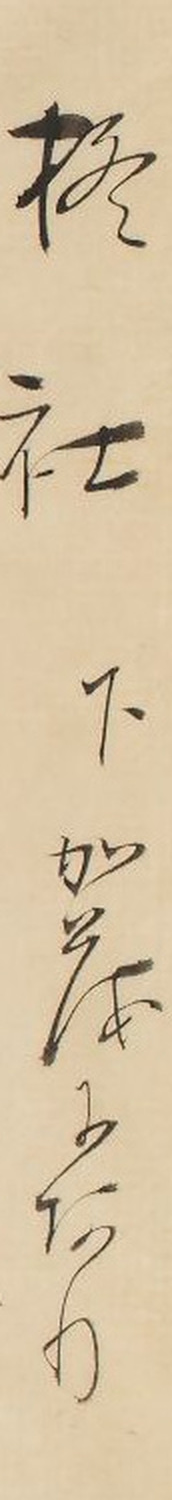柊社下賀茂にあり
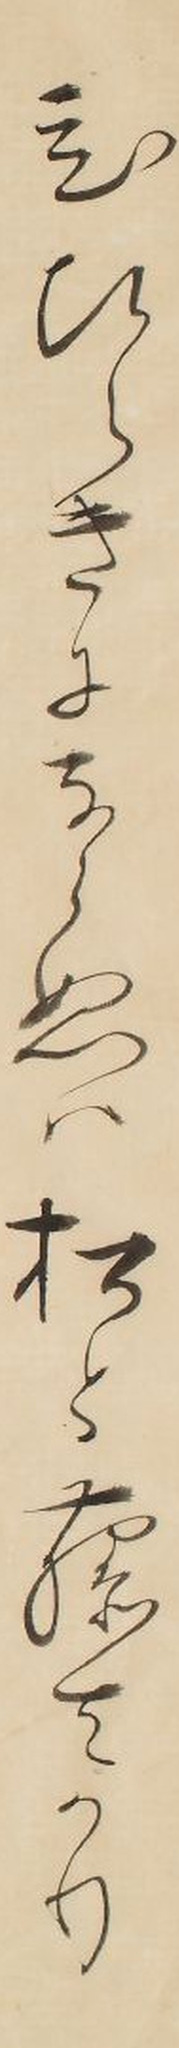ひゝらきにならぬは松と藤はかり
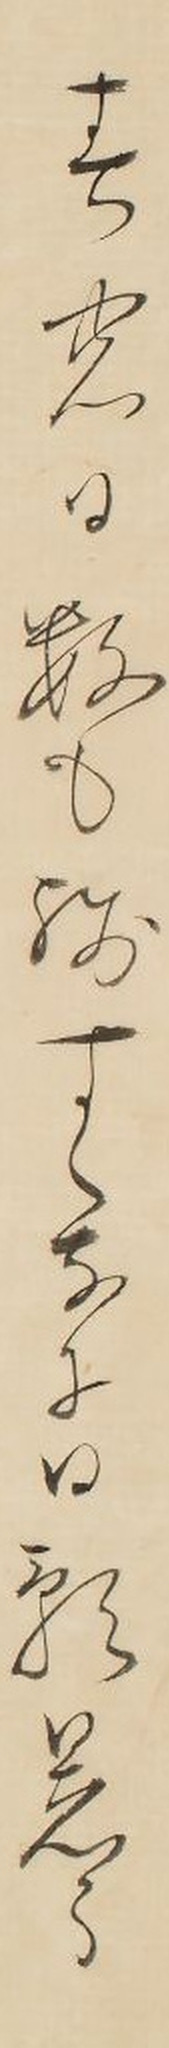春の日数も残すくなに日影暑く
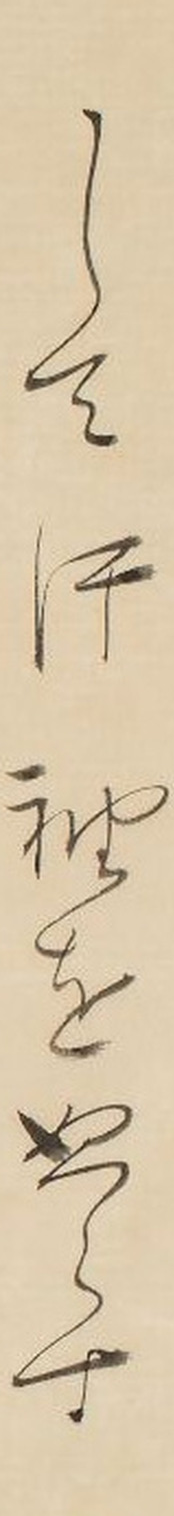して片袖をぬらす
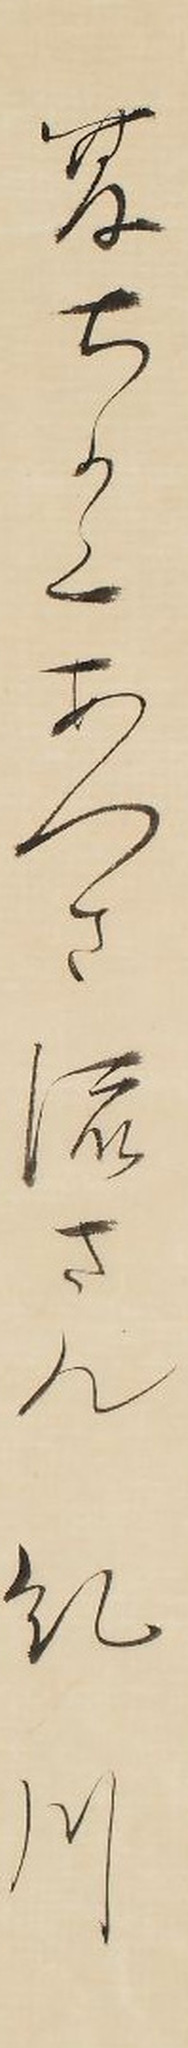夏ちかくあつさ流さん糺川
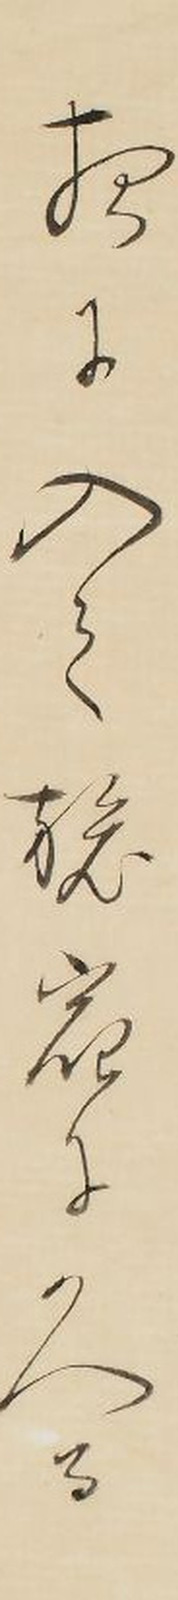夜に入て旅宿にかへる
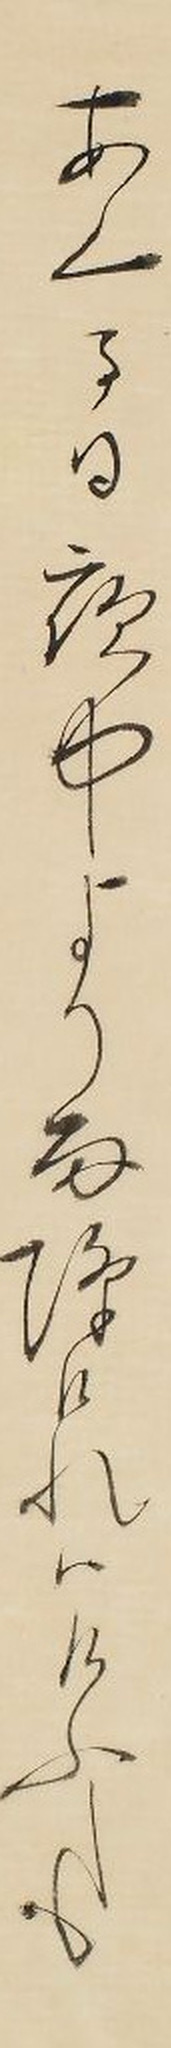あくる日夜中より雨降りけれはけふしも
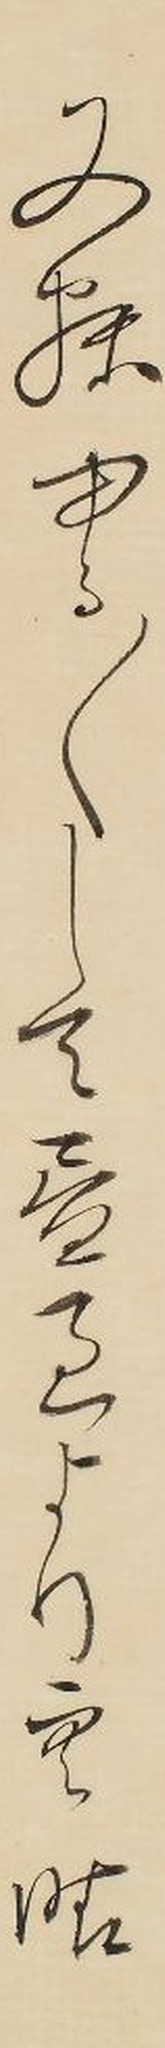又寝ゆる〳〵して昼過より空晴
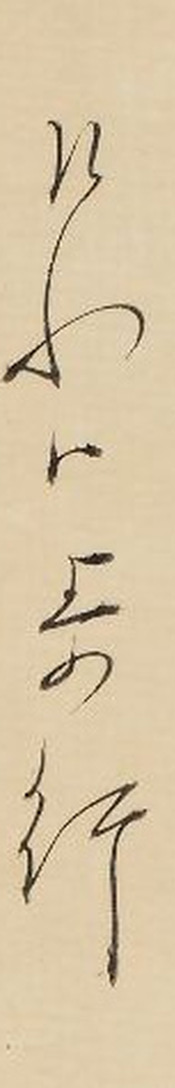けれは歩行
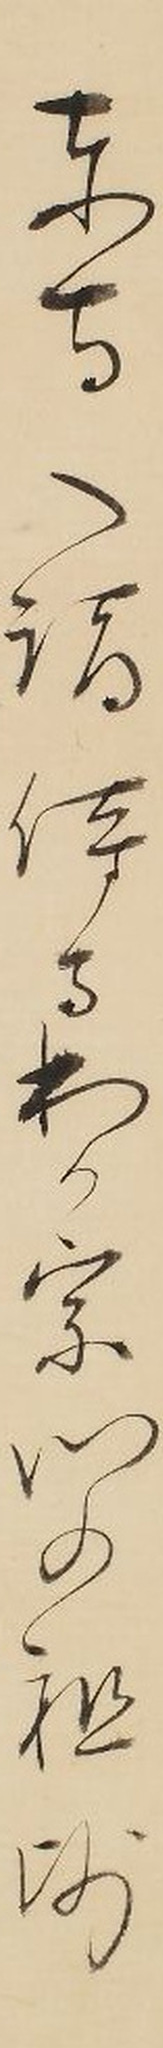東寺へ詣侍るわか宗門の祖師
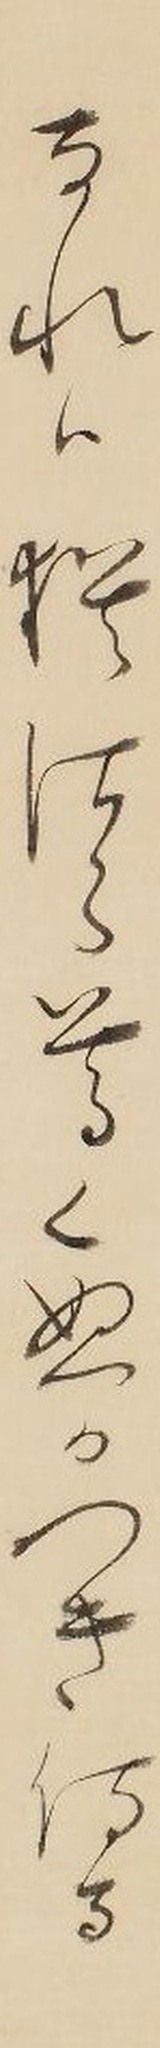なれは猶さら尊くぬかつき侍る
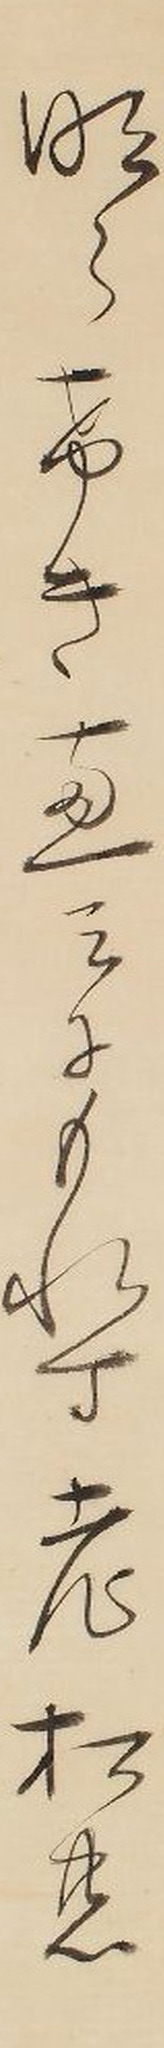明らけき恵みにもれす老松の
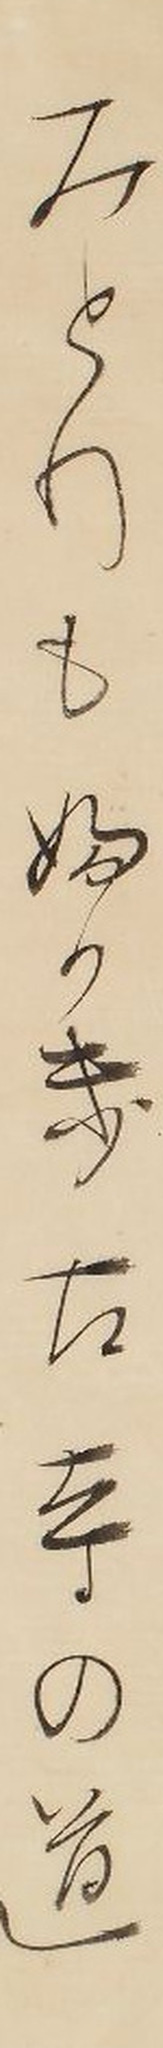みとりもふかき古寺の道
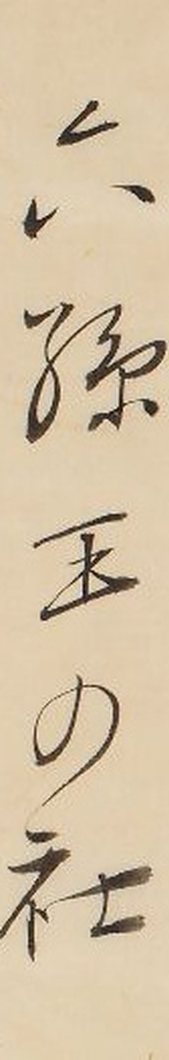六孫王の社
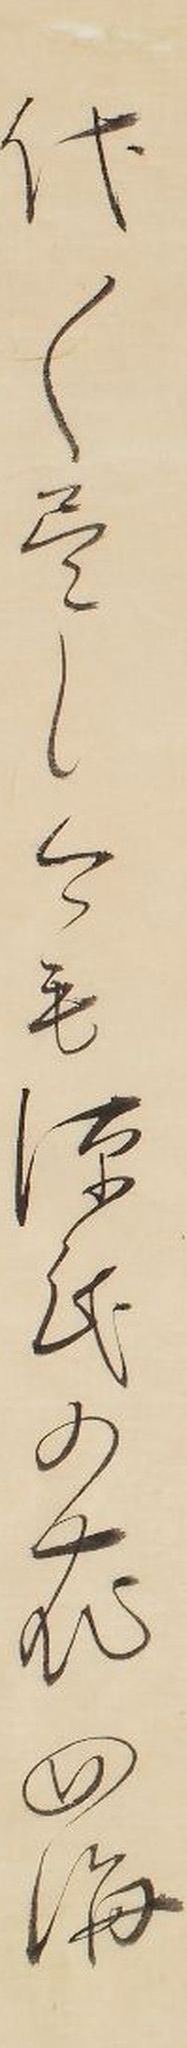代〳〵尽し今も源氏の花四海
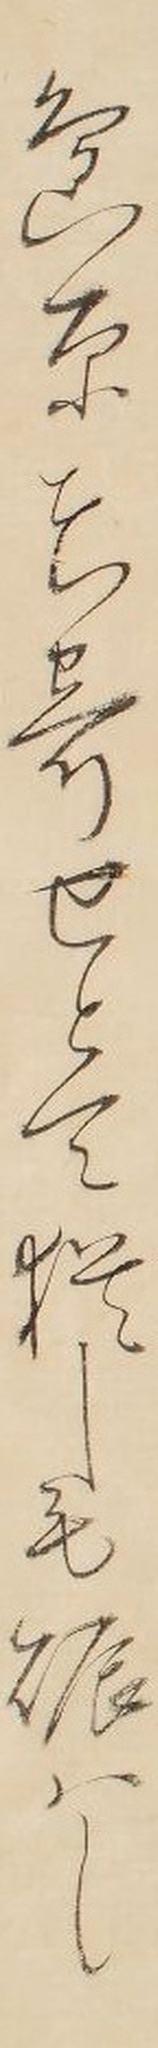島原花寄せとて猶しも賑はし
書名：花土産
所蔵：徳島県立図書館
